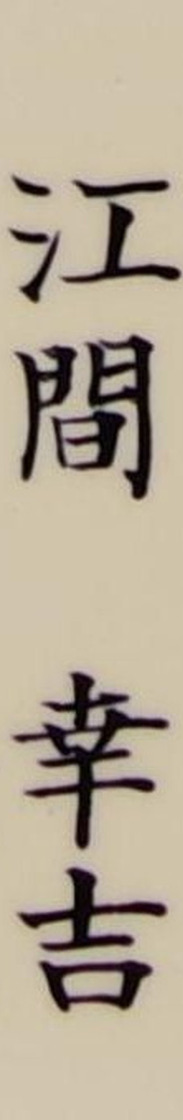江間幸吉
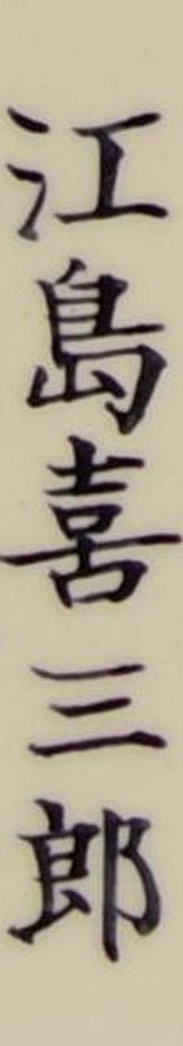江島喜三郎
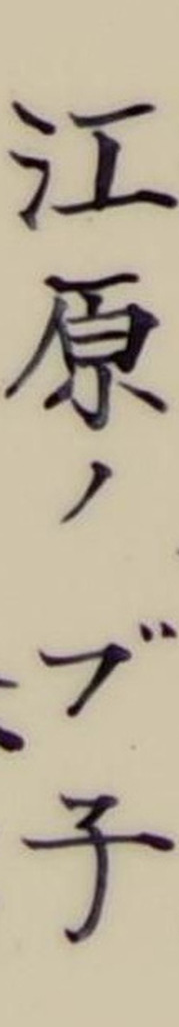江原ノブ子
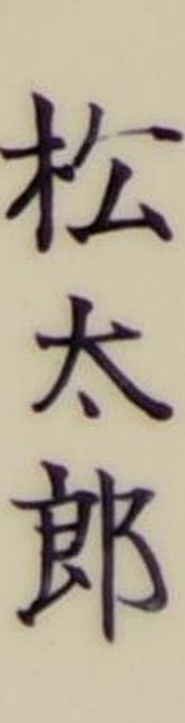松太郎
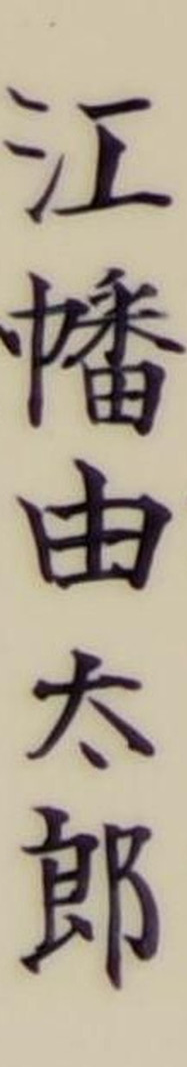江幡由太郎
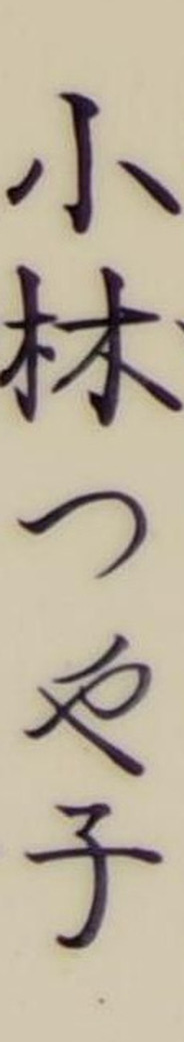小林つや子
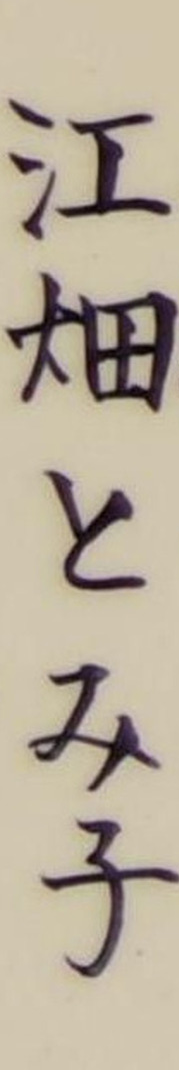江畑とみ子
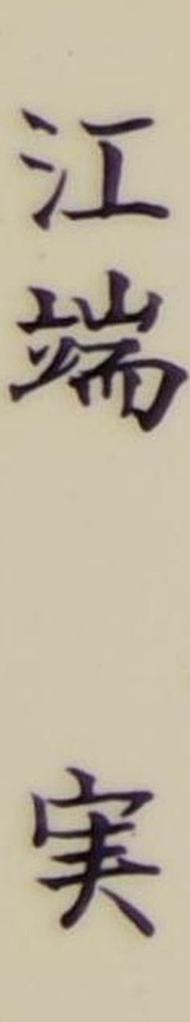江端実
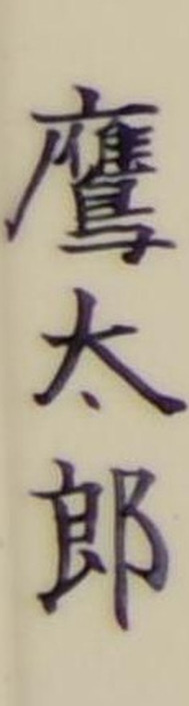鷹太郎

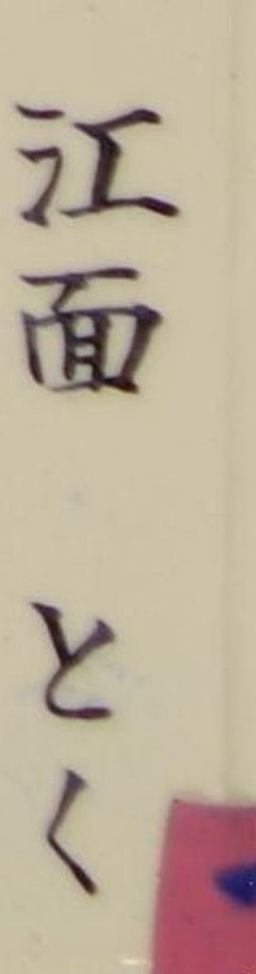江面とく
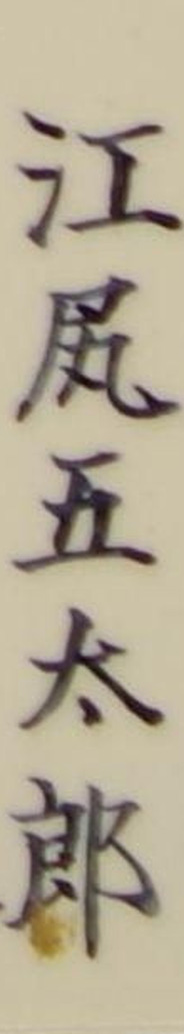江尻五太郎
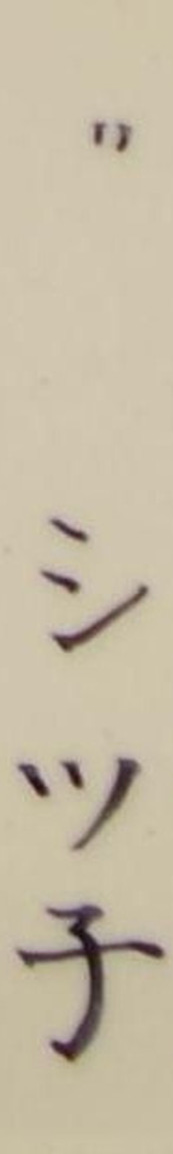シツ子
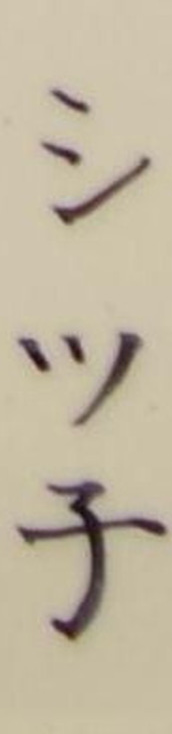シツ子
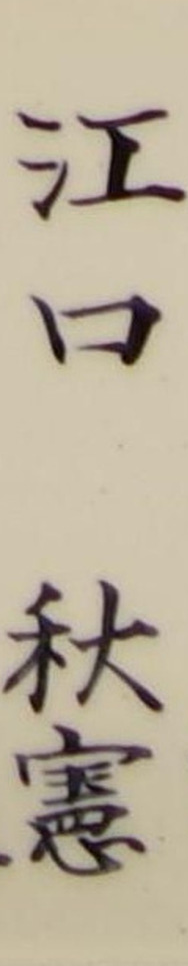江口秋憲
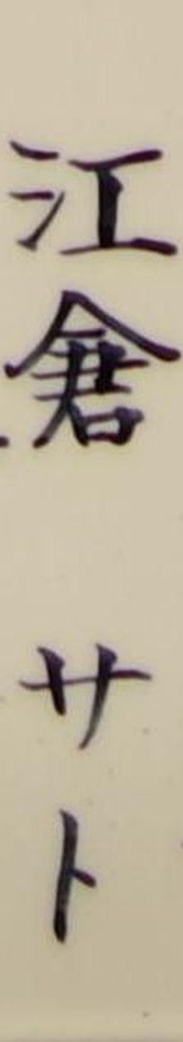江倉サト
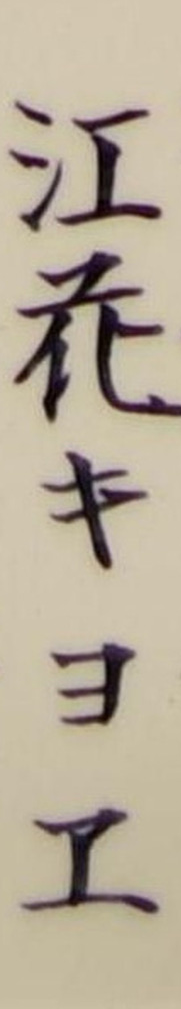江花キヨヱ
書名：E~L
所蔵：高野山金剛峯寺
